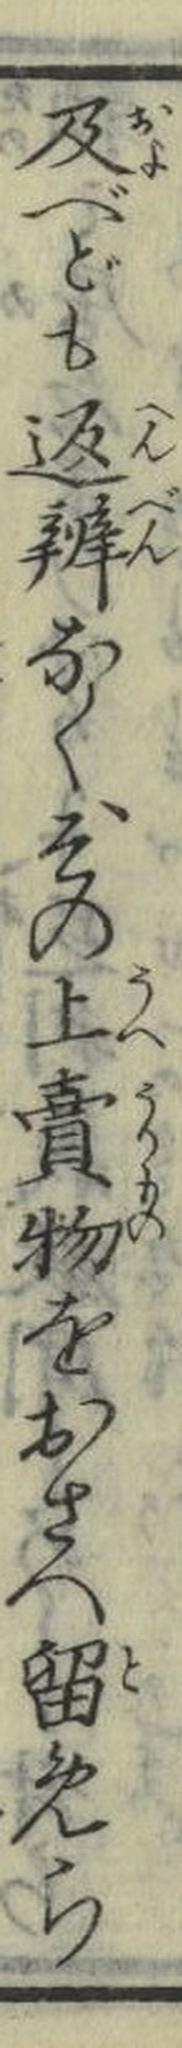及べども返弁なく、その上売物をおさへ留めら
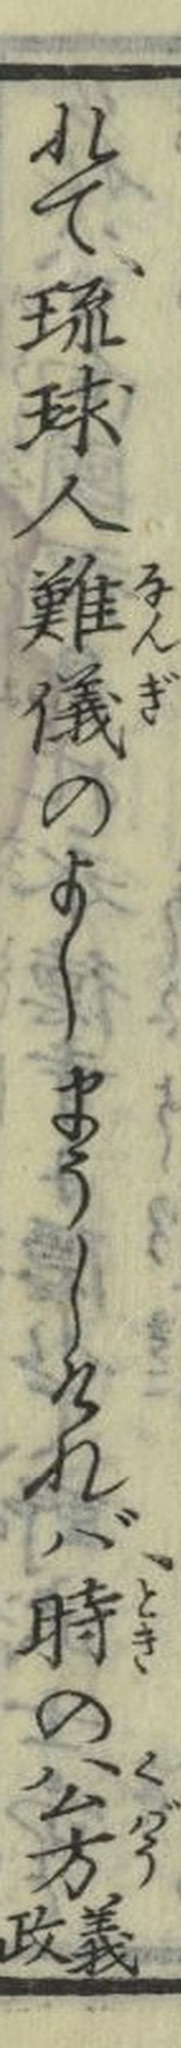れて、琉球人難義のよしまうしければ、時の公方義政
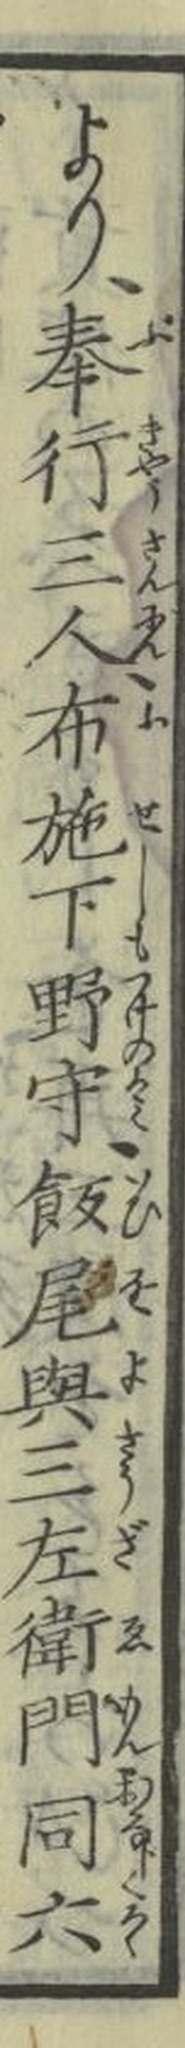より、奉行三人、布施下野守、飯尾与三左衛門同六
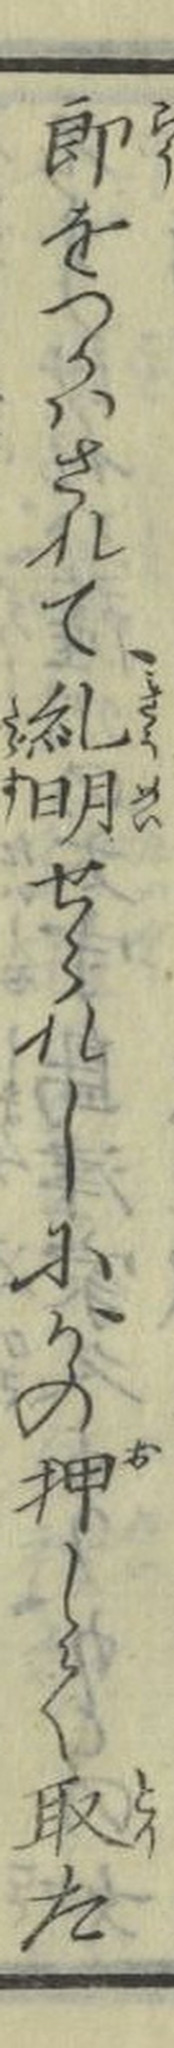郎をつかはされて、糺明せられしに、かの押して取た
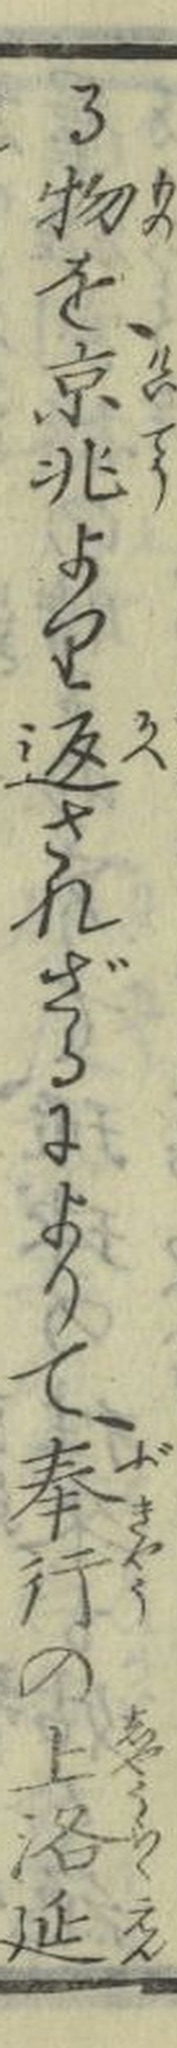る物を、京兆より返されざるによりて、奉行の上洛延
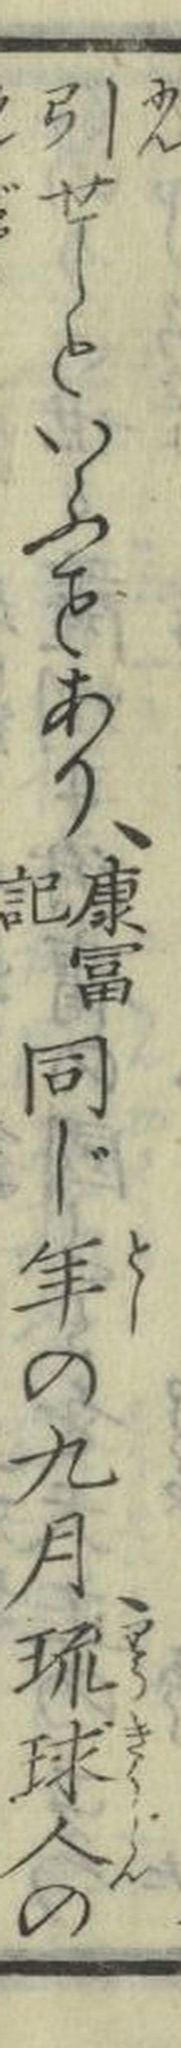引せしといふことあり、康富記同じ年の九月、琉球人の
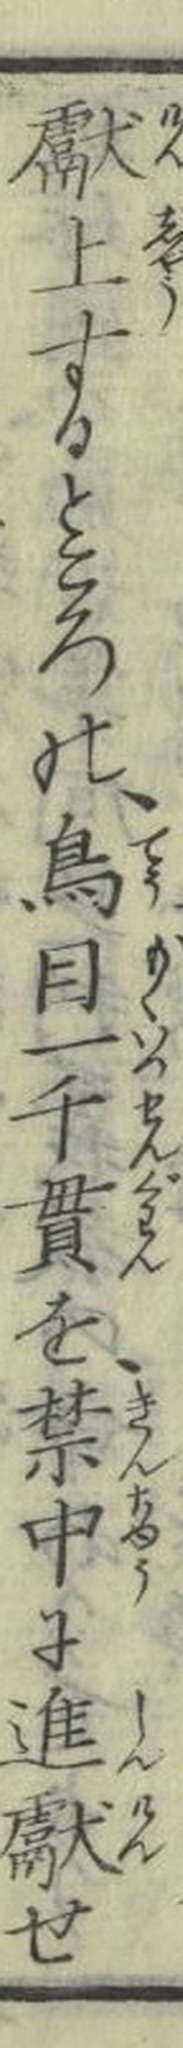献上するところの、鳥目一千貫を、禁中に進献せ
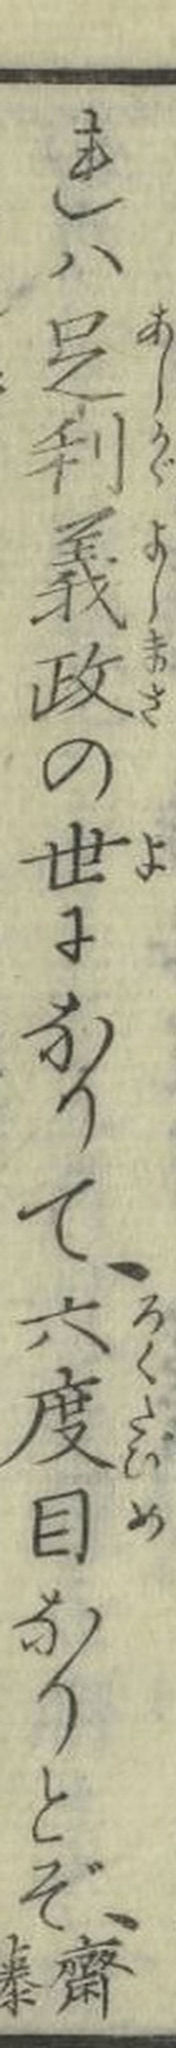れは足利義政の世になりて、六度目なりとぞ、斎藤
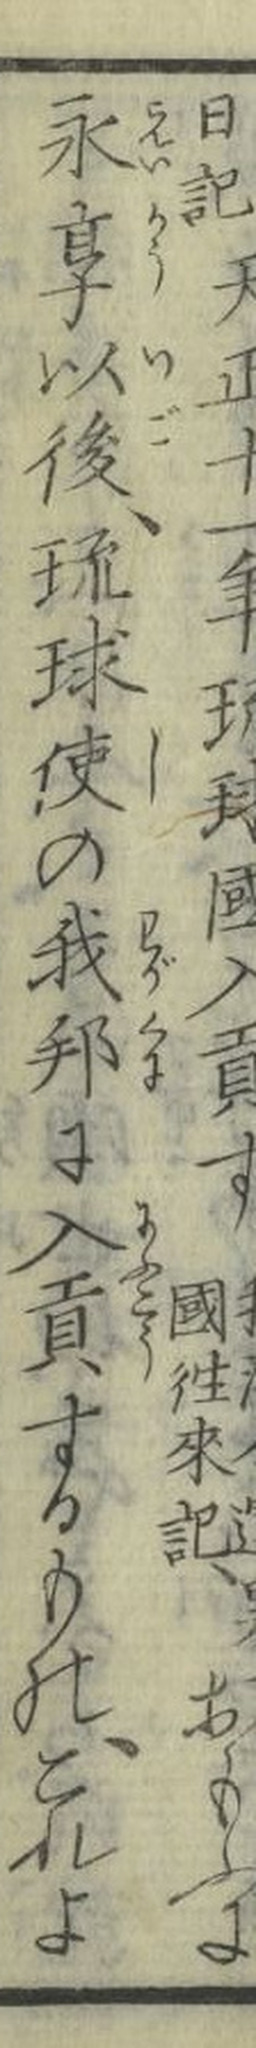永享以後、琉球使の我邦に入貢するもの、これよ

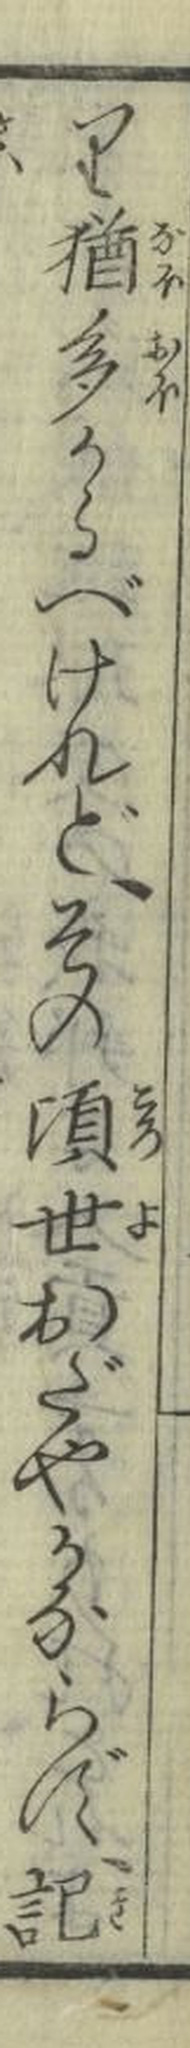り猶多かるべけれど、その頃世おだやかならず、記
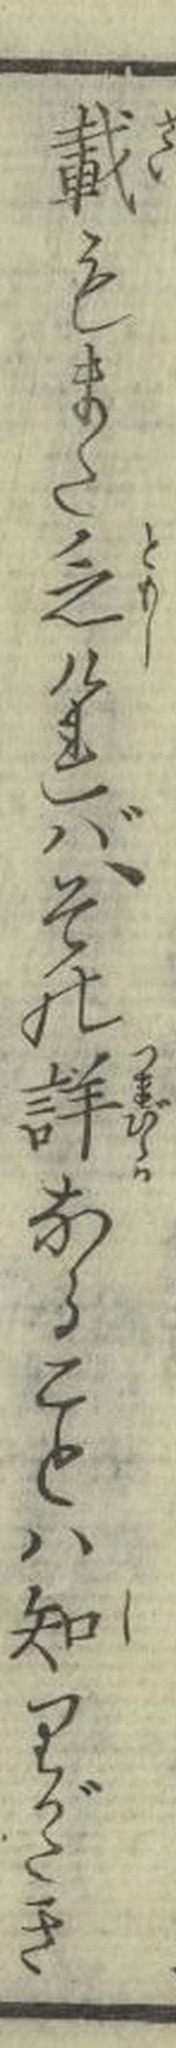載もまたに乏ければ、その詳なることは知りがたき
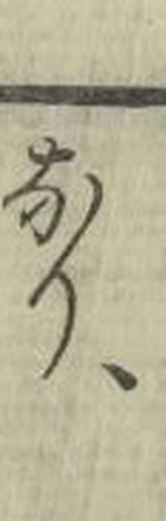なり、
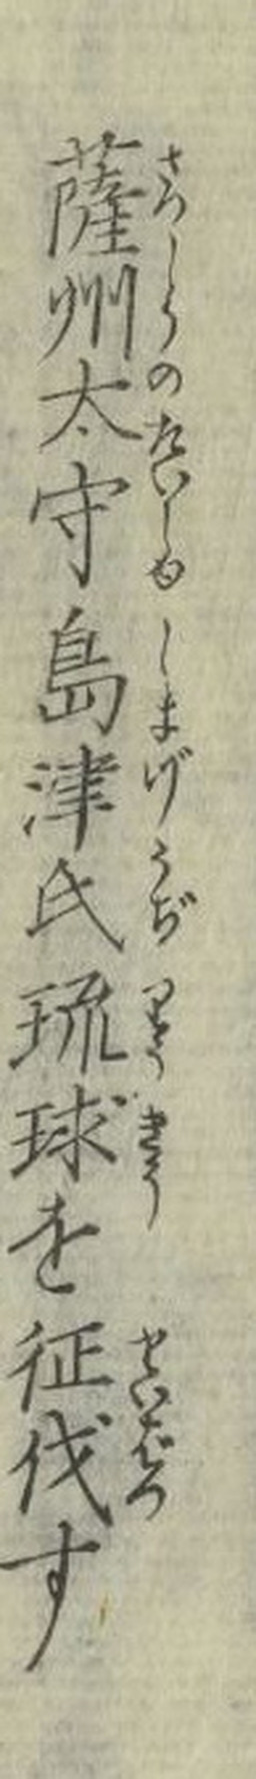薩州太守島津氏琉球を征伐す
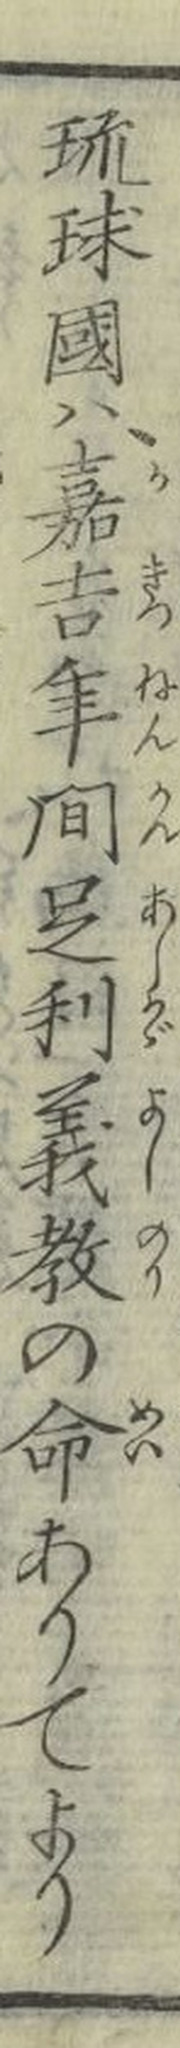琉球国は、嘉吉年間足利義教の命ありてより
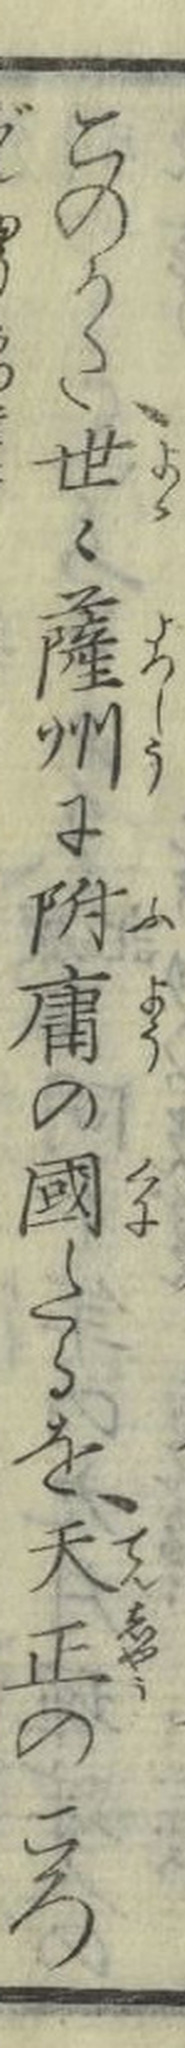このかた、世々薩州に附庸の国たるを、天正のころ
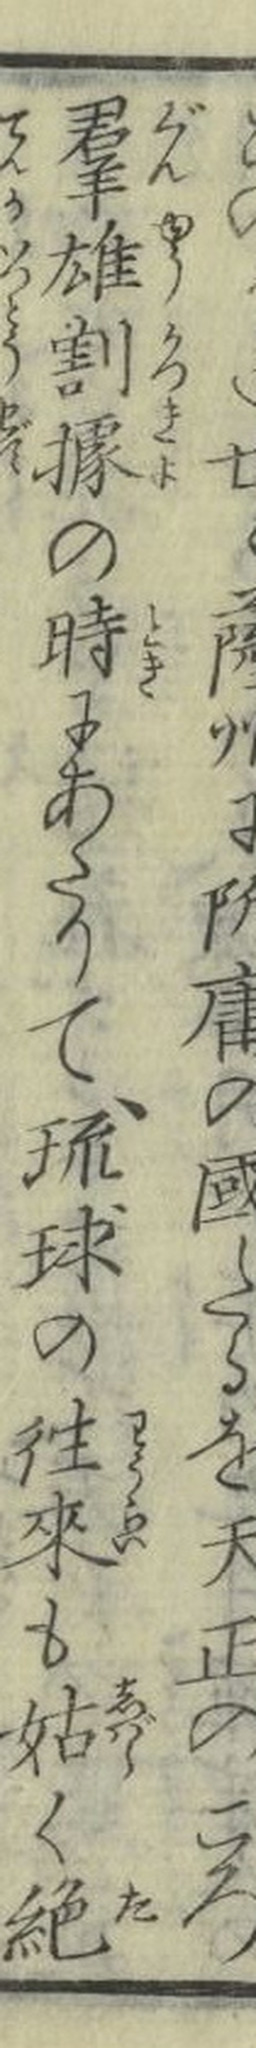群雄割拠の時にあたりて、琉球の往来も姑く絶
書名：琉球入貢紀畧
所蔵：University of the Ryukyus Library
